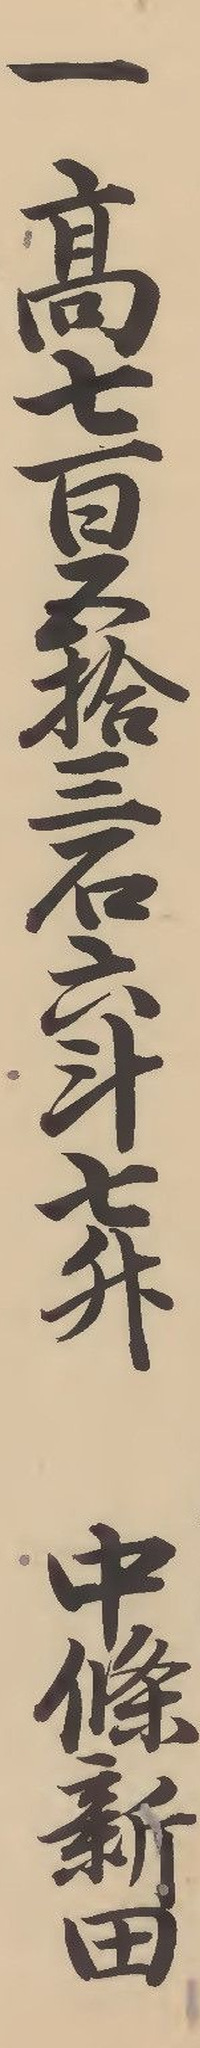一高七百五拾三石六斗七升中条新田
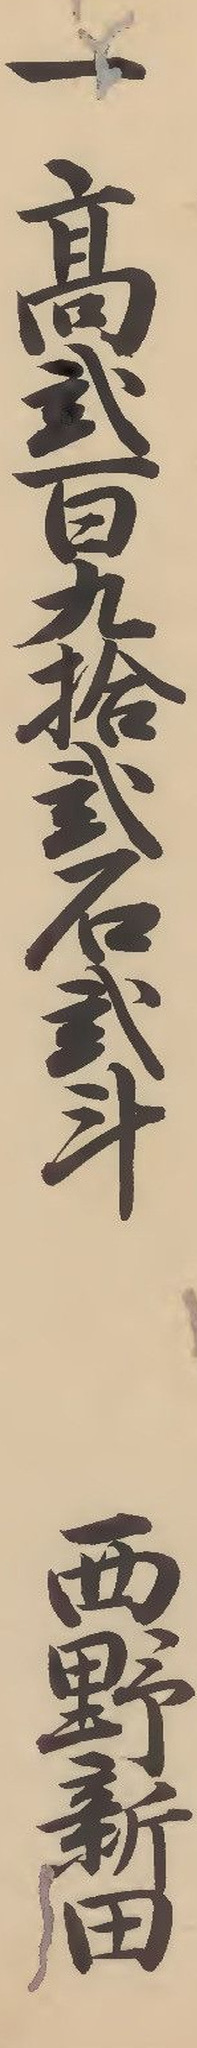一高弐百九拾弐石弐斗西野新田
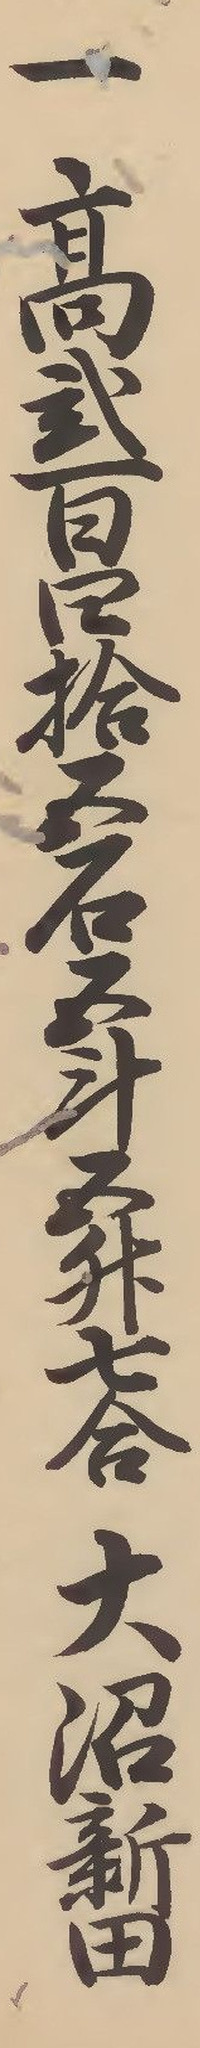一高弐百四拾五石五斗五升七合大沼新田

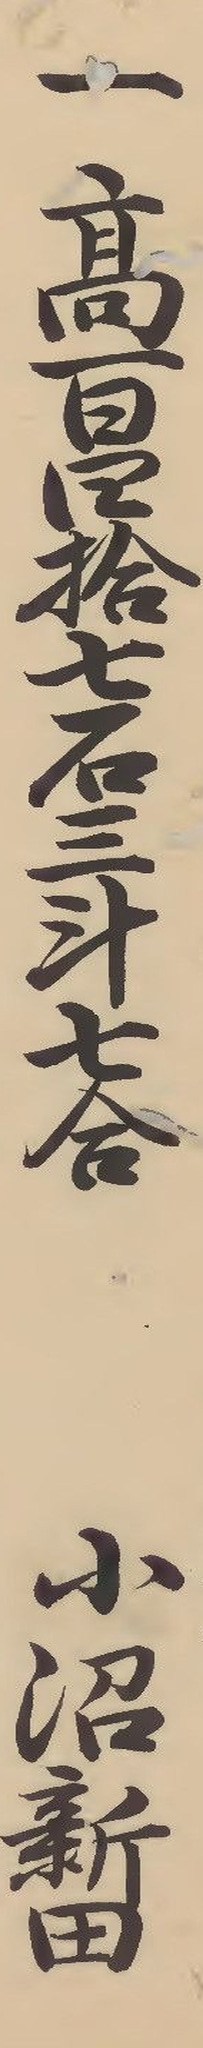一高百四拾七石三斗七合小沼新田
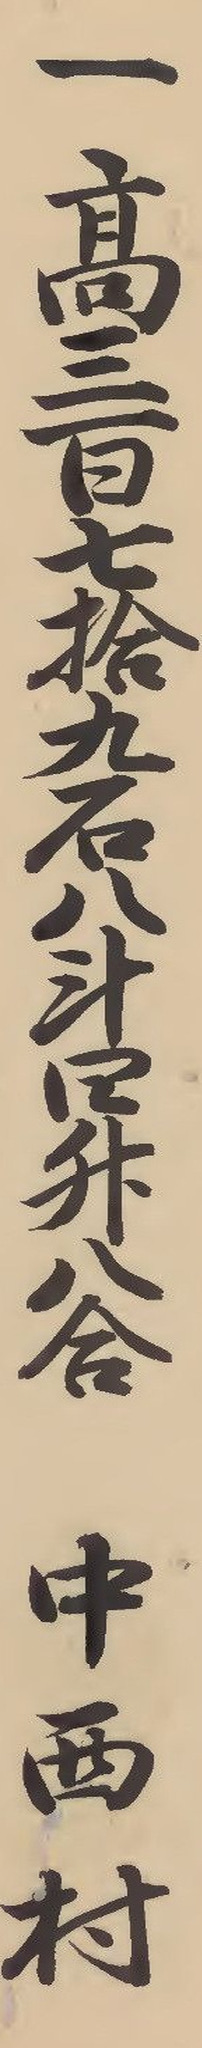一高三百七拾九石八斗四升八合中西村
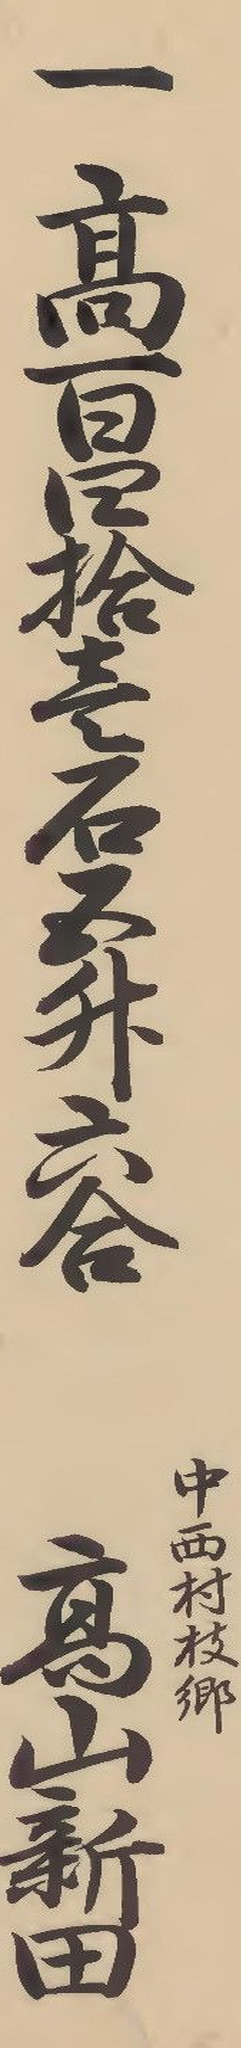一高百四拾壱石五升六合高山新田
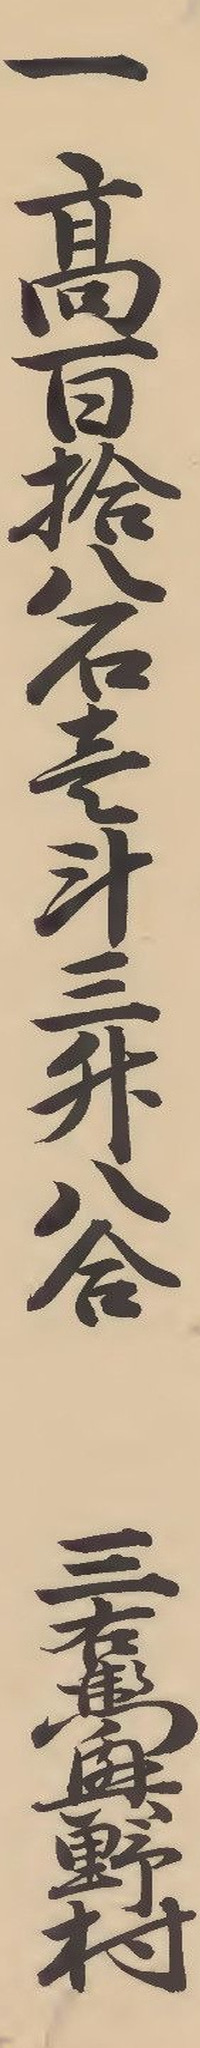一高百拾八石壱斗三升八合三右衛門興野村
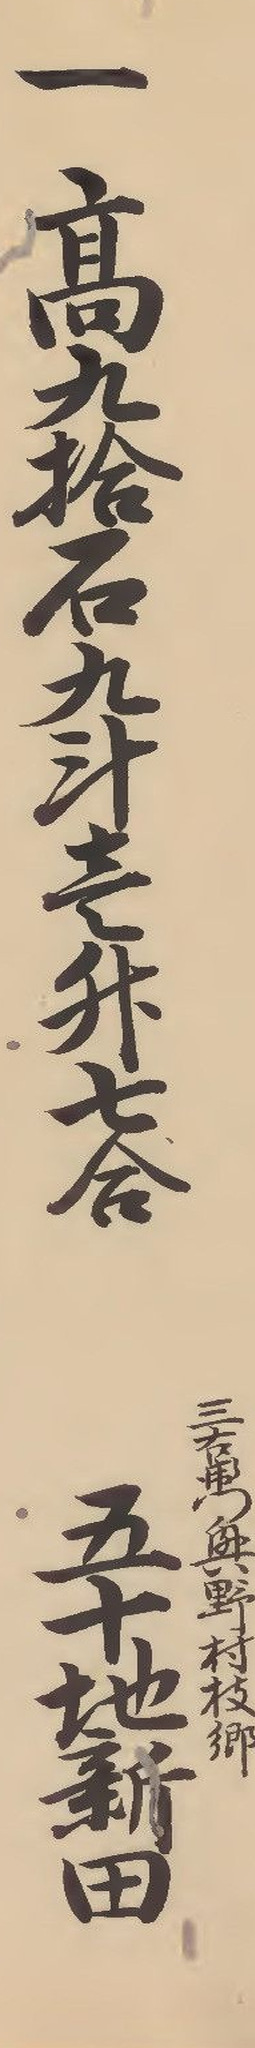一高九拾石九斗壱升七合五十地新田
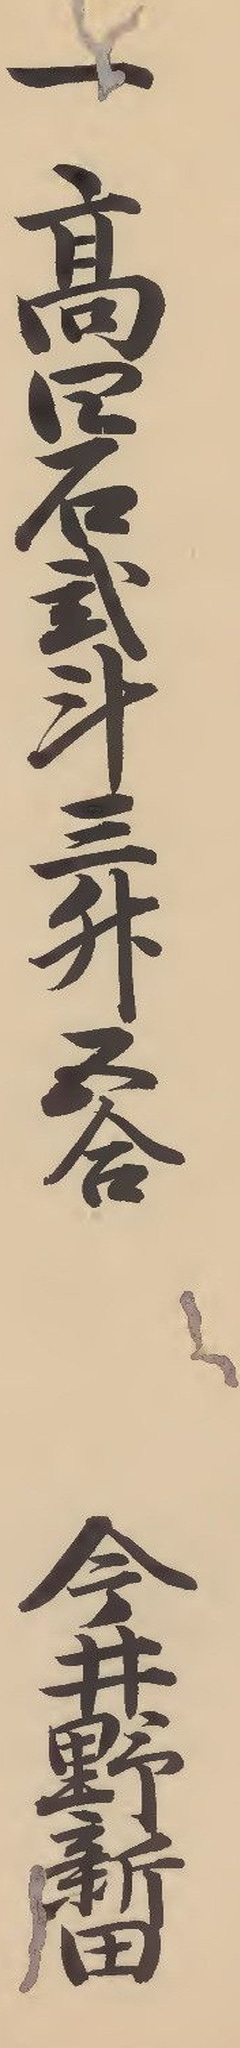一高四石弐斗三升五合今井野新田
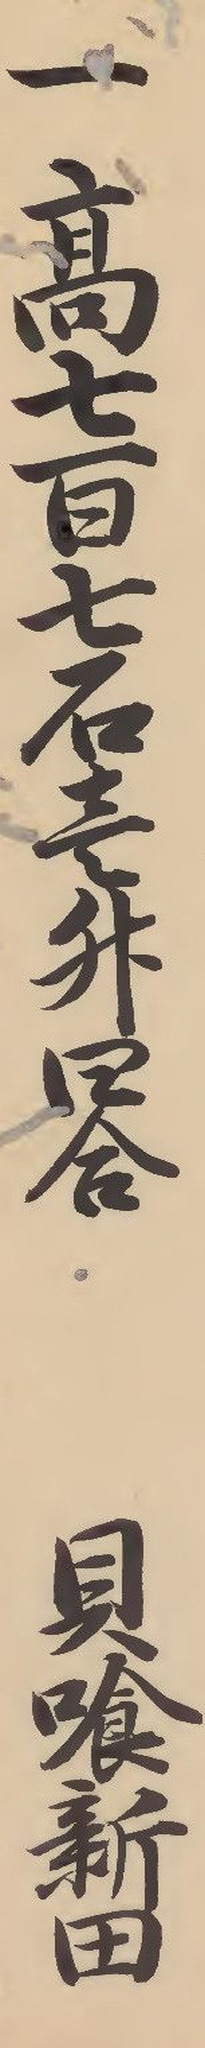一高七百七石壱升四合貝喰新田

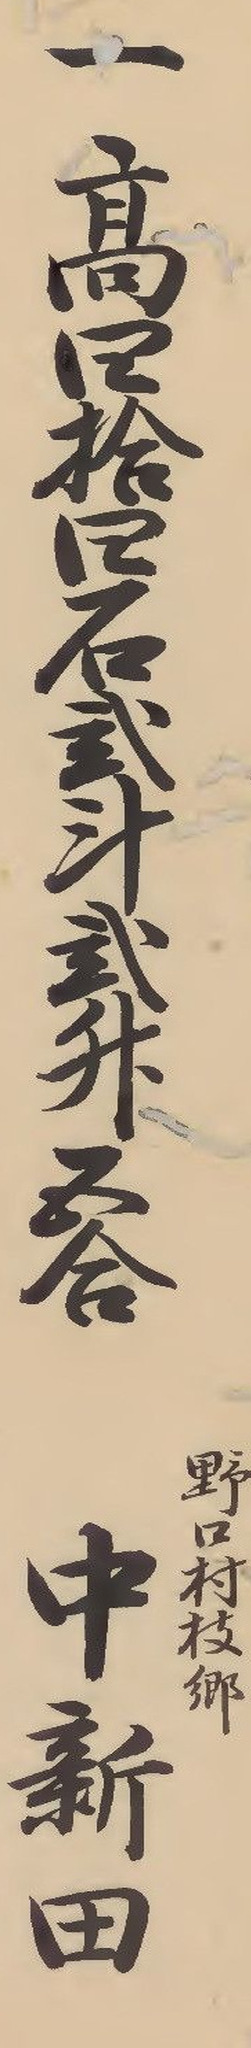一高四拾四石弐斗弐升五合中新田
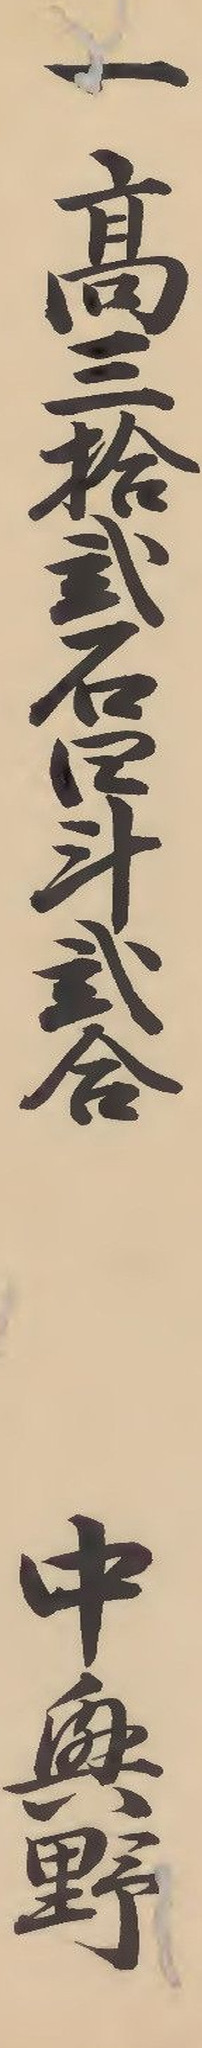一高三拾弐石四斗弐合中興野
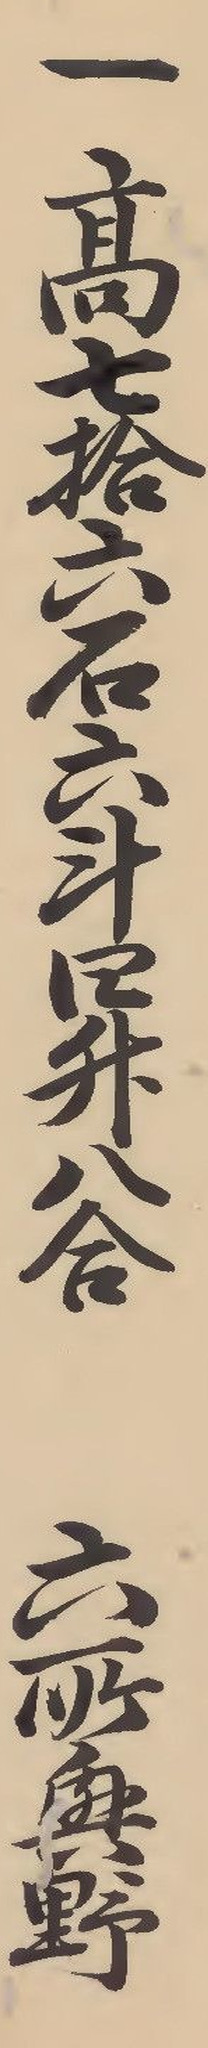一高七拾六石六斗四升八合六所興野
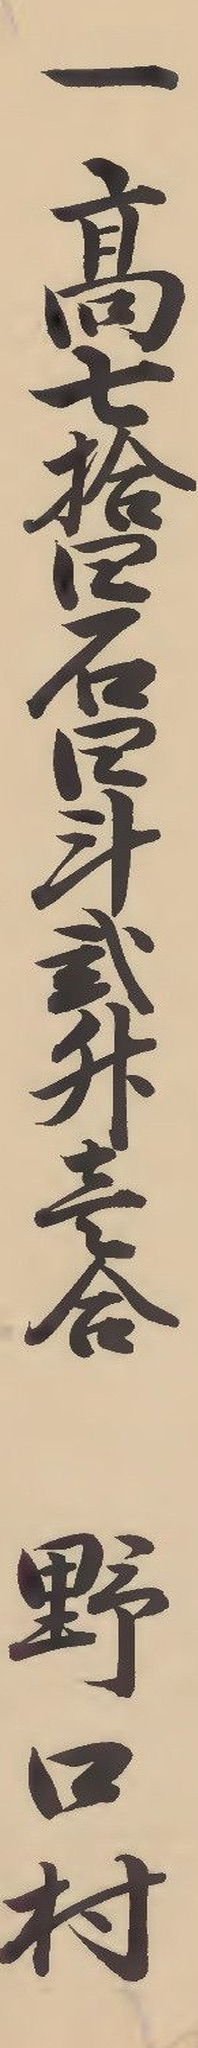一高七拾四石四斗弐升壱合野口村
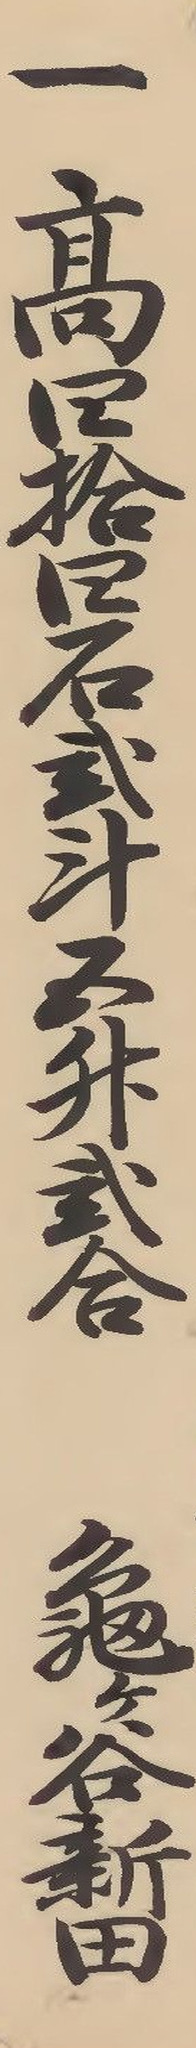一高四拾四石弐斗五升弐合亀ヶ谷新田
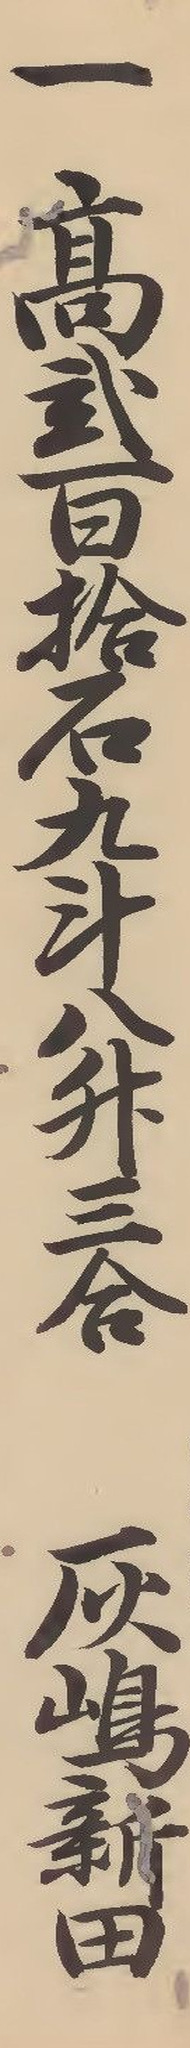一高弐百拾石九斗八升三合灰島新田
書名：越後国郷帳　下
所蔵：国立公文書館 National Archives of Japan
